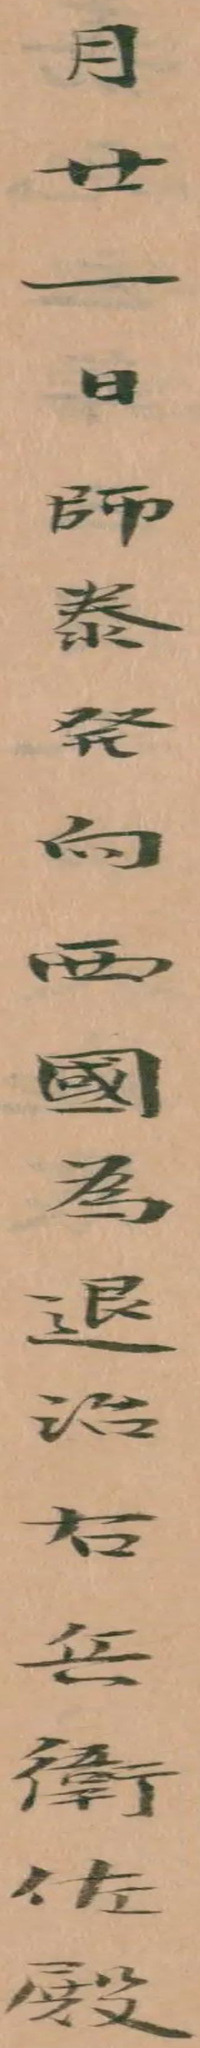月廿一日師泰発向西国為退治右兵衛佐殿
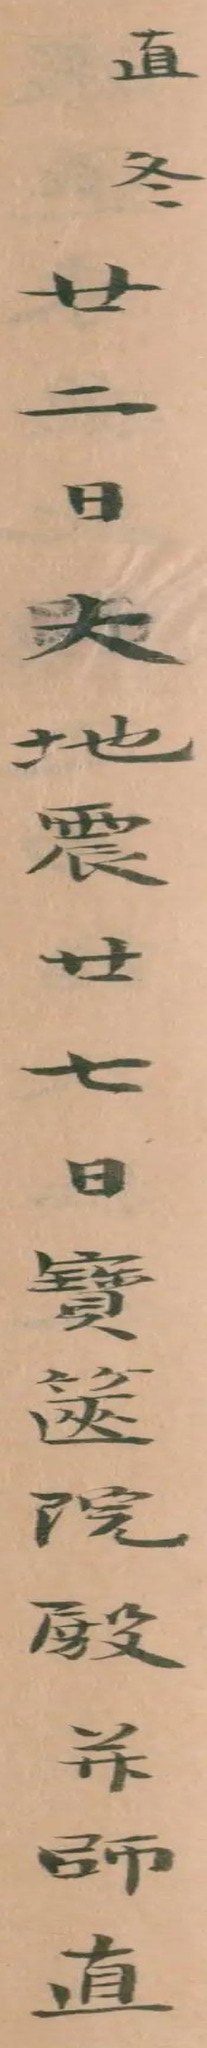直冬廿二日大地震廿七日宝篋院殿幷師直
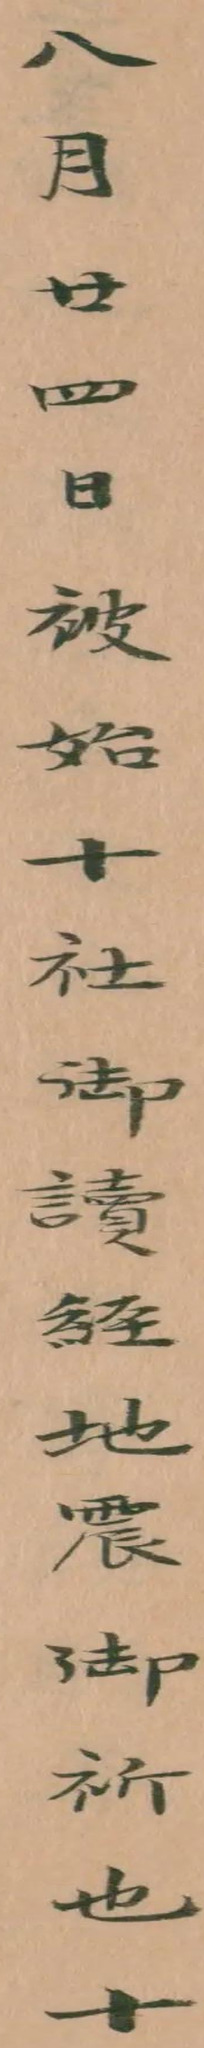八月廿四日被始十社御読経地震御祈也十
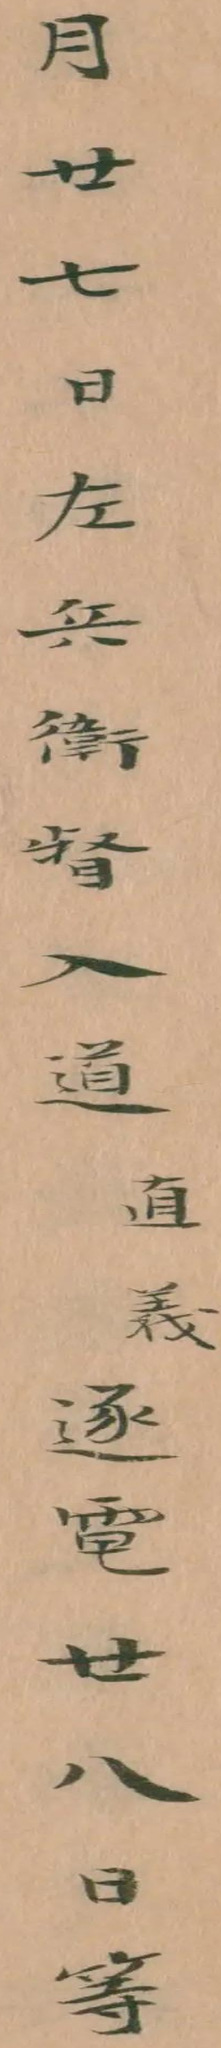月廿七日左兵衛督入道直義逐電廿八日等
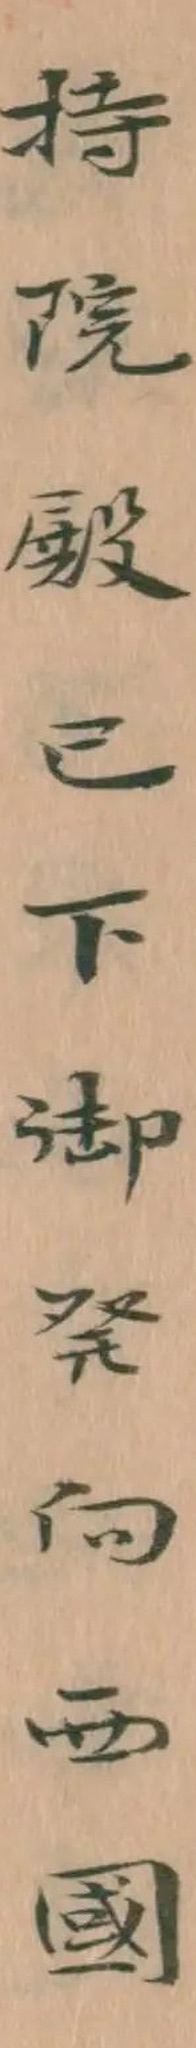持院殿已下御発向西国
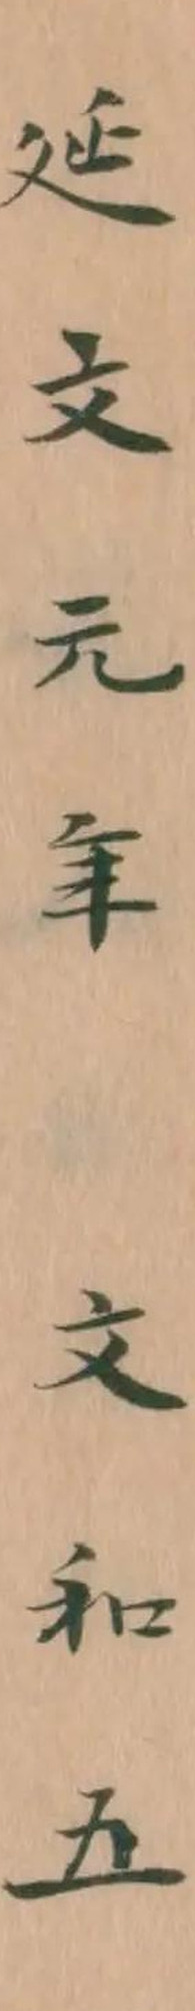延文元年文和五
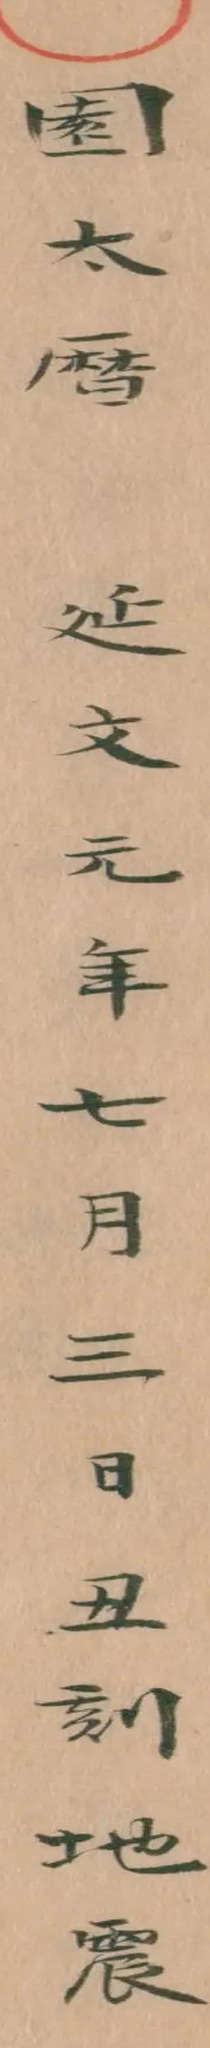○園太暦延文元年七月三日丑刻地震
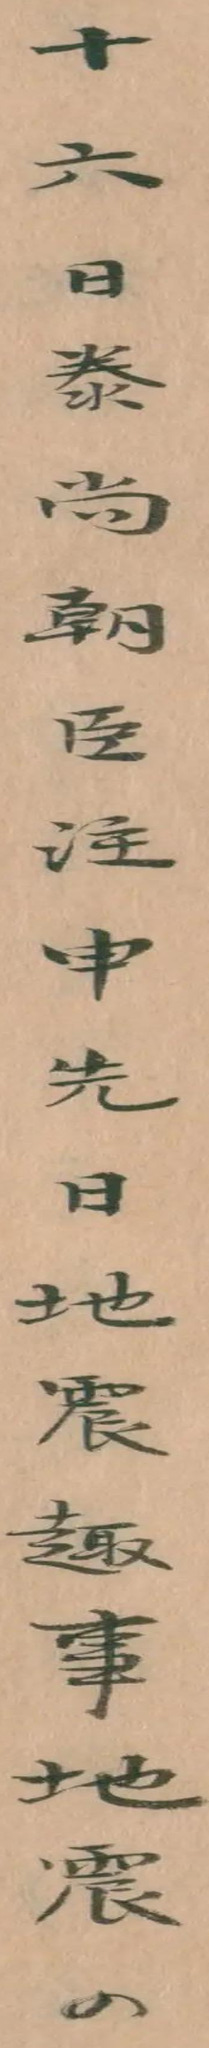十六日泰尚朝臣注申先日地震趣事地震の
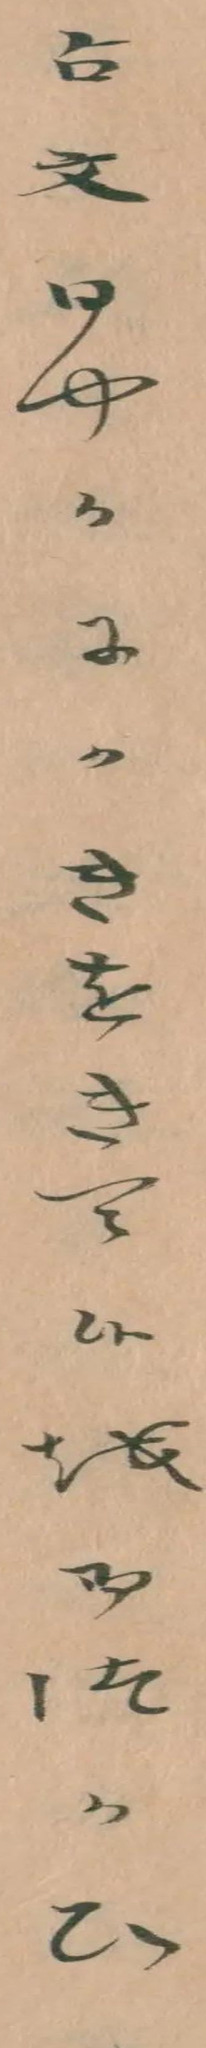占文日ゆるにかきをきて候を御つかひ候
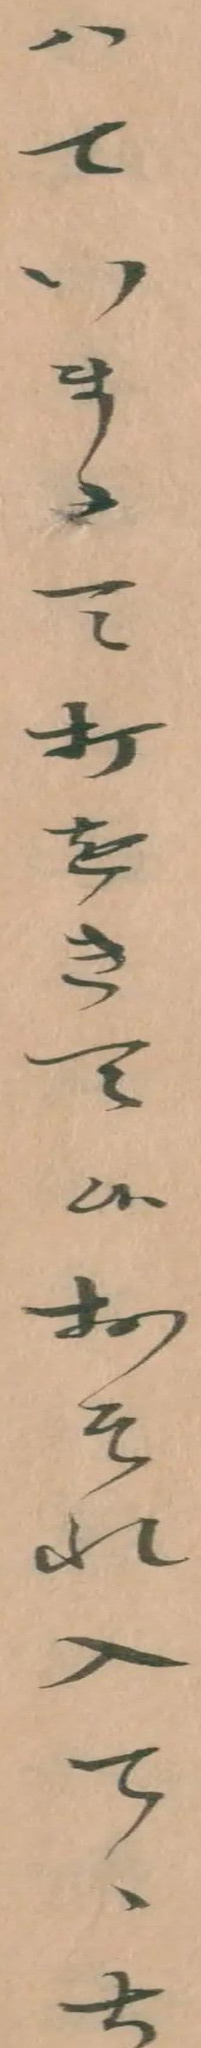はていまゝて打をきて候おそれ入て候ち

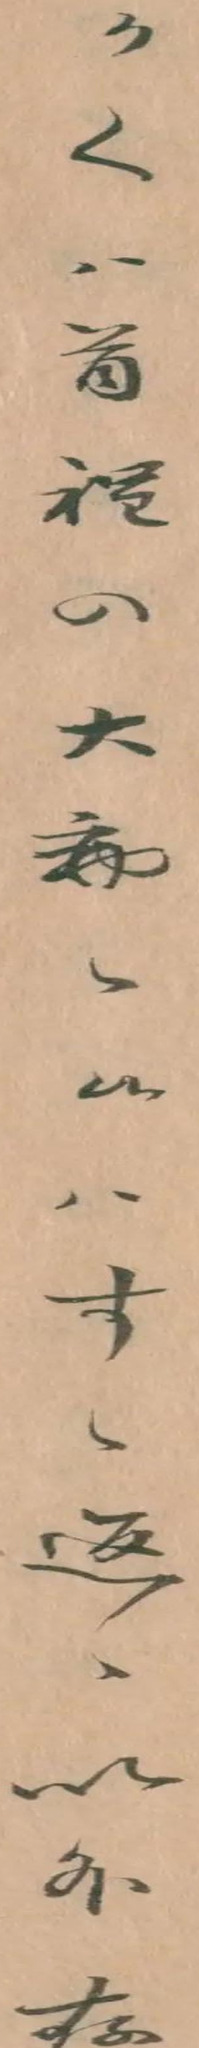かくは首程の大動候候はす候返候以外存
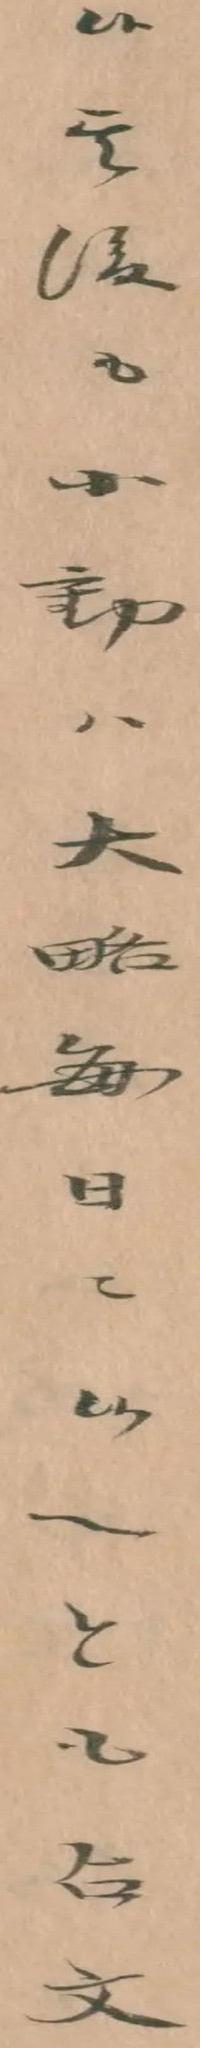候其後も小動は大略毎日と候へとも占文
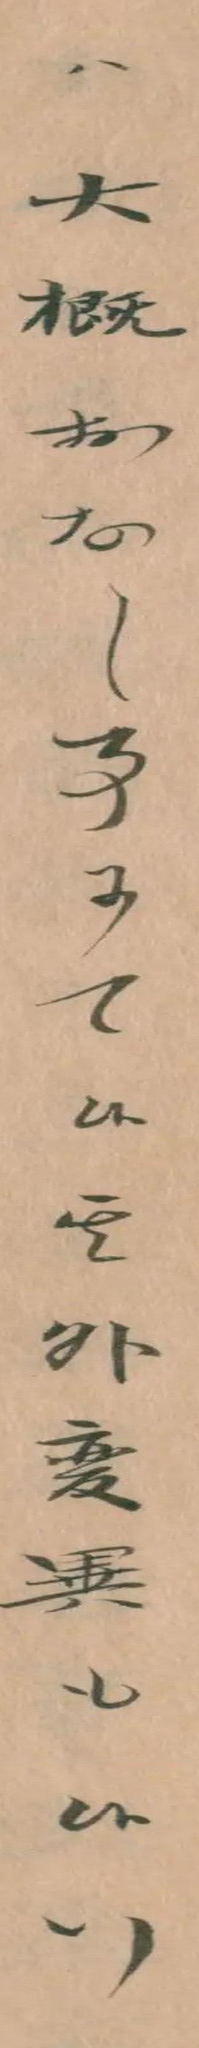は大概おなし事にて候其外変異も候はゝ
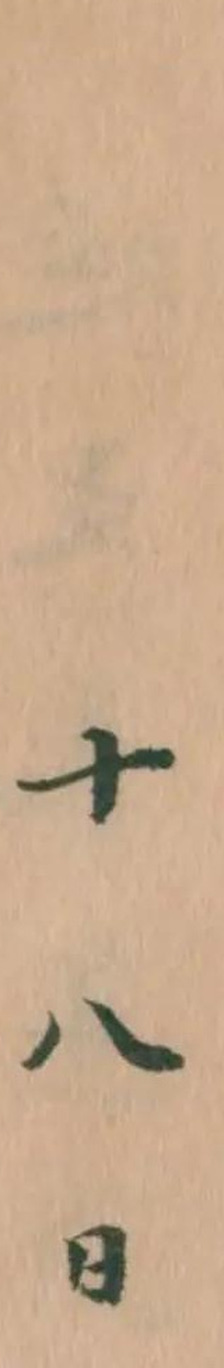十八日
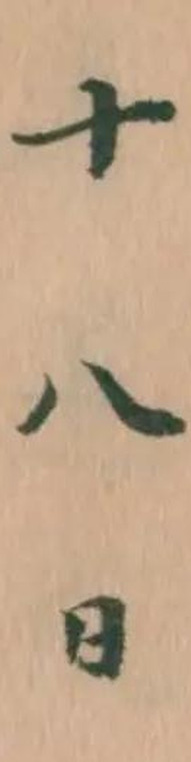十八日
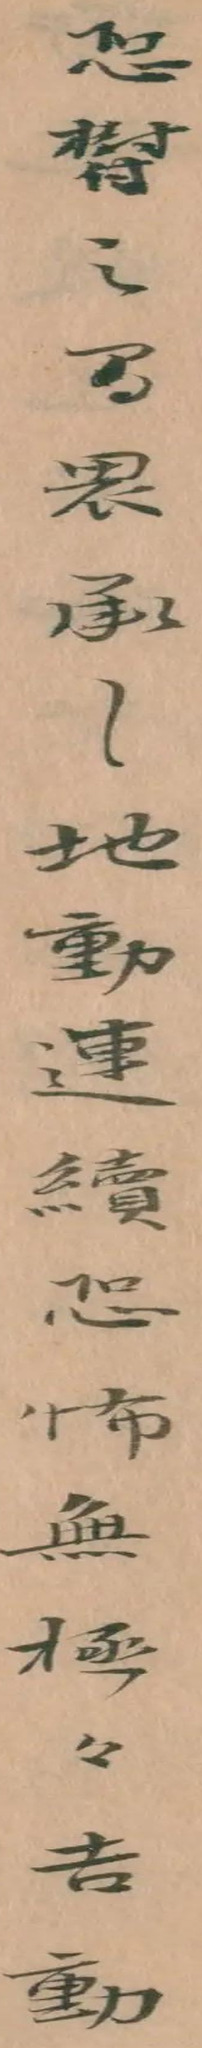恐鬱之間畏承し地動連続恐怖無極々𠮷動
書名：地災撮要. 巻5-6(地震之部)
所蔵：国立国会図書館 National Diet Library, JAPAN
